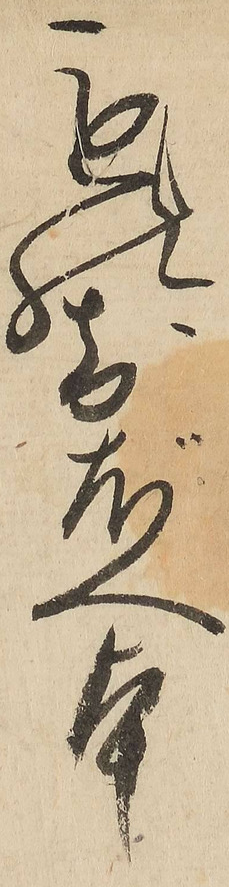ものおぼへ本
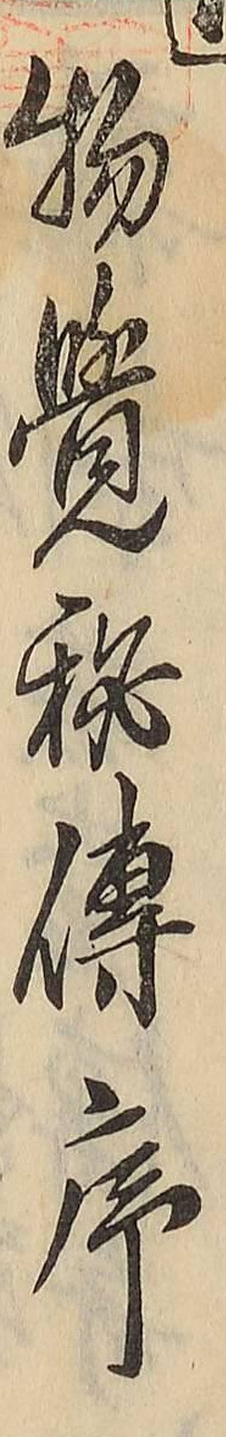物覚秘伝序
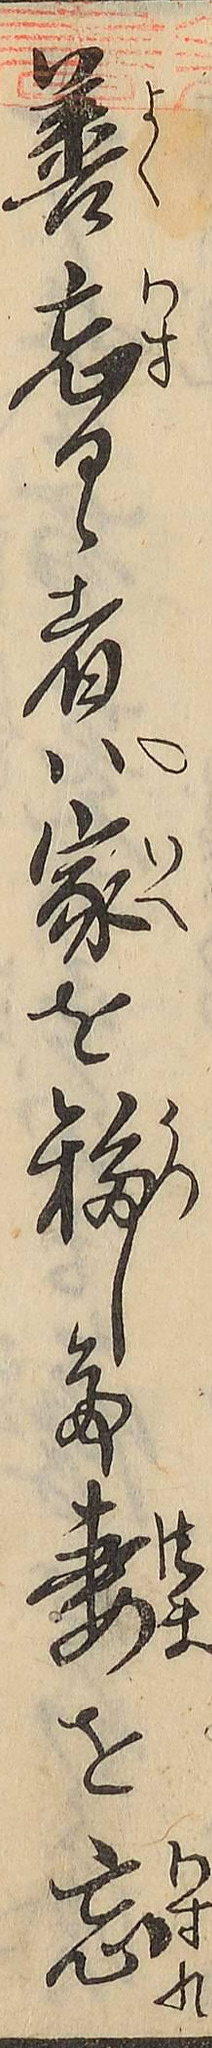善忘るゝ者は。家を移して妻を忘。
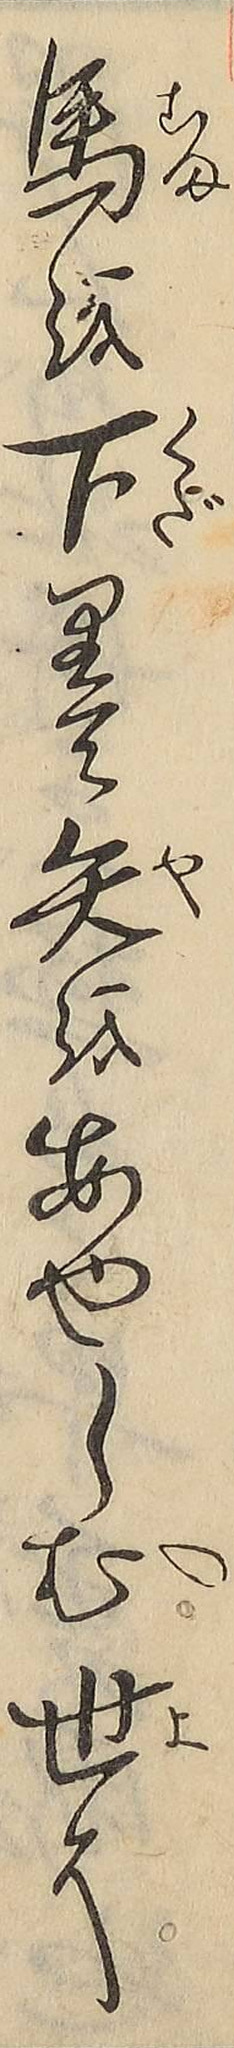馬を下りて矢をあやしむ。世に
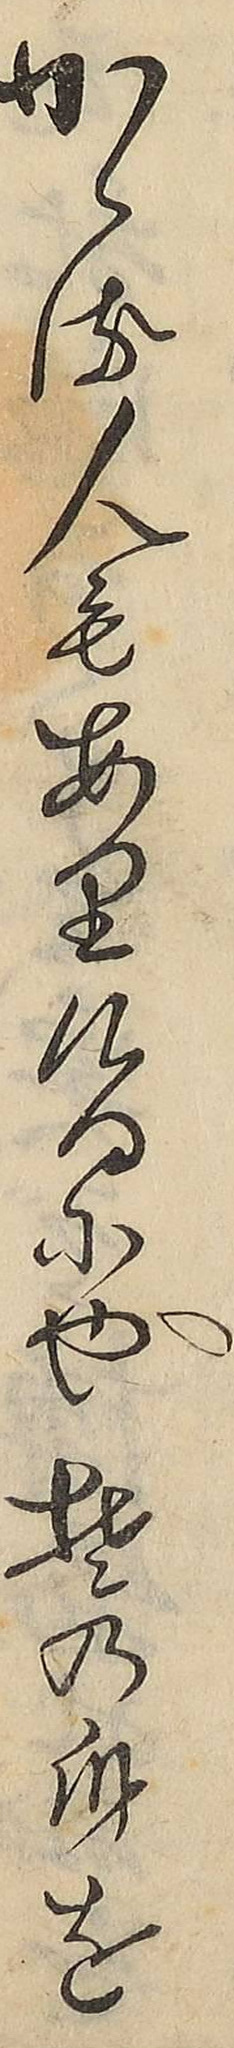かゝる人もありけるにや。その身を
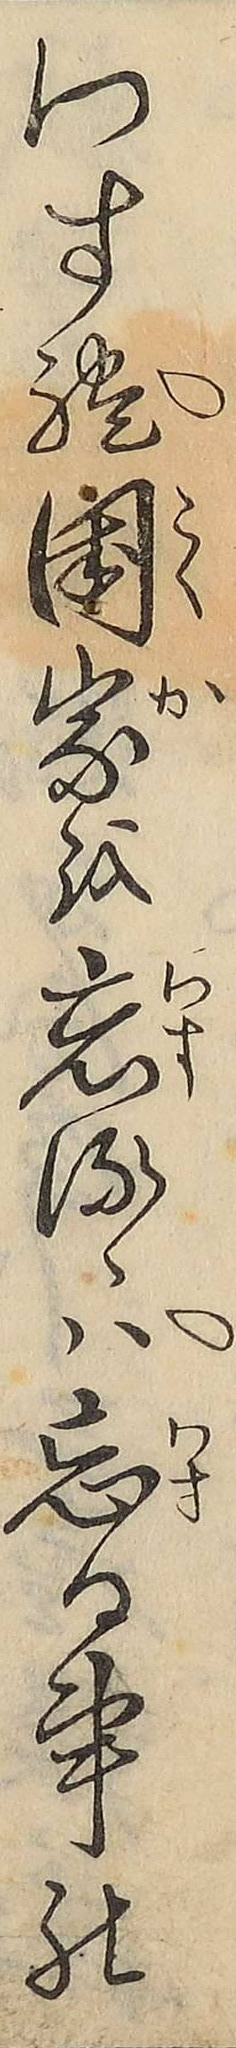わすれ。国家を忘るゝは。忘る事の
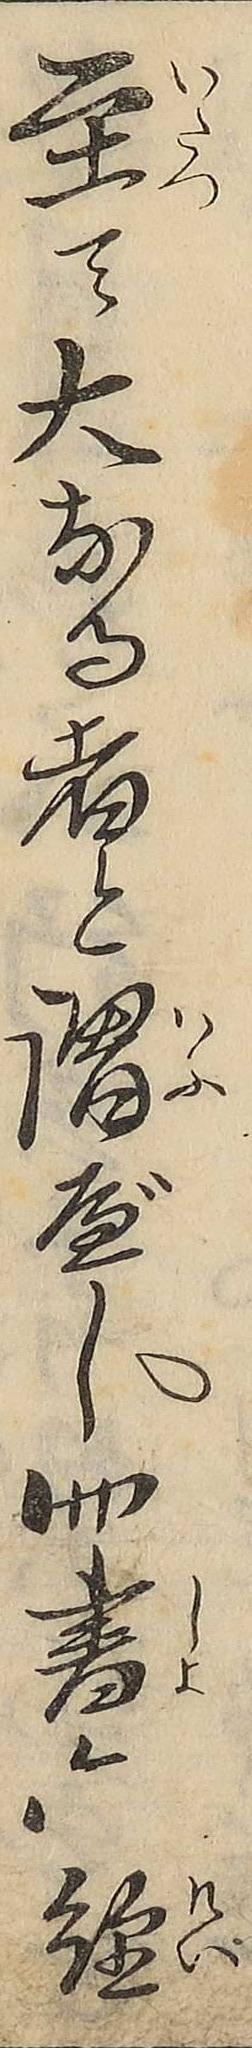至て大なる者と謂べし。四書六経
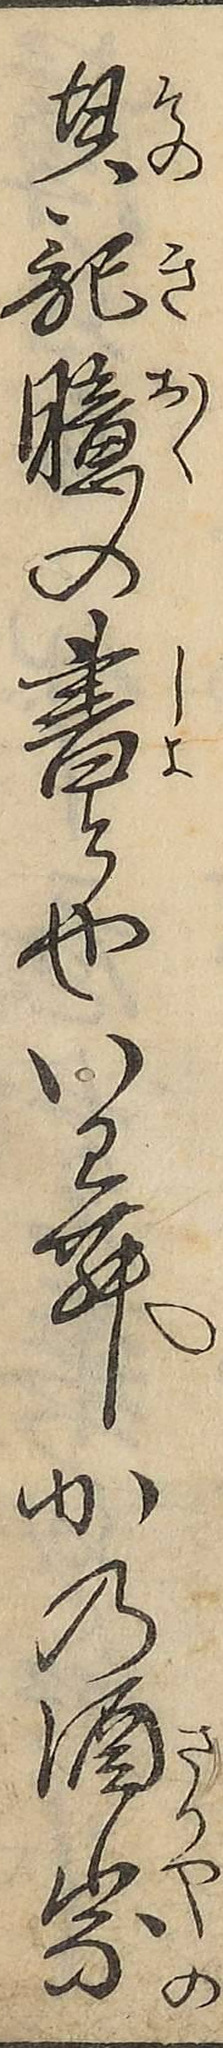其記臆の書とやいわむ。かの酒家

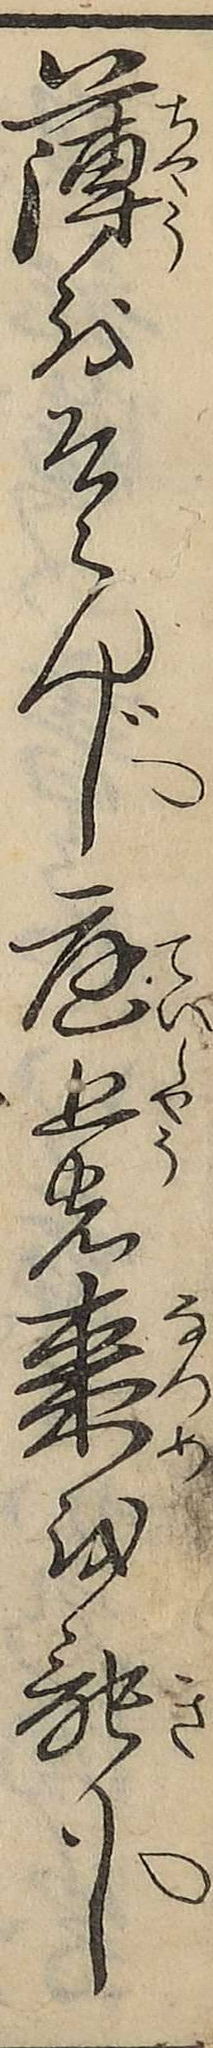薄をそらんじ。庭上の棗を記し。
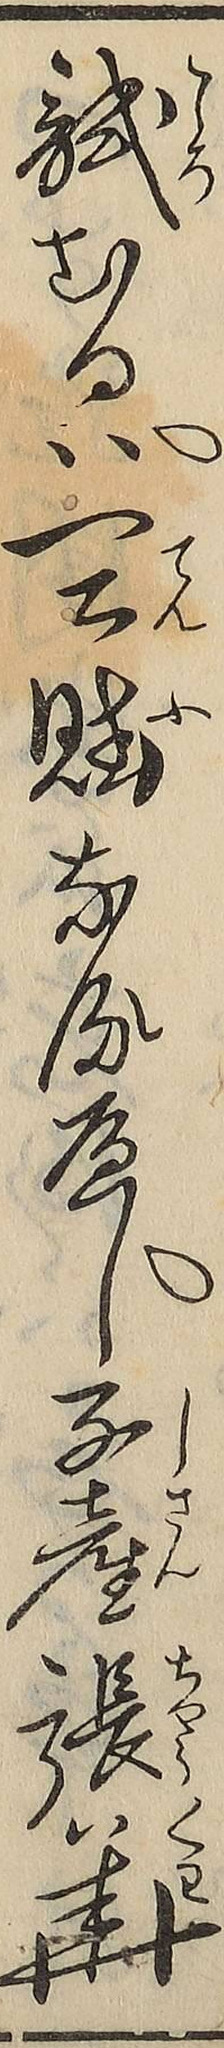試むるは。天賦なるへし。子産張華
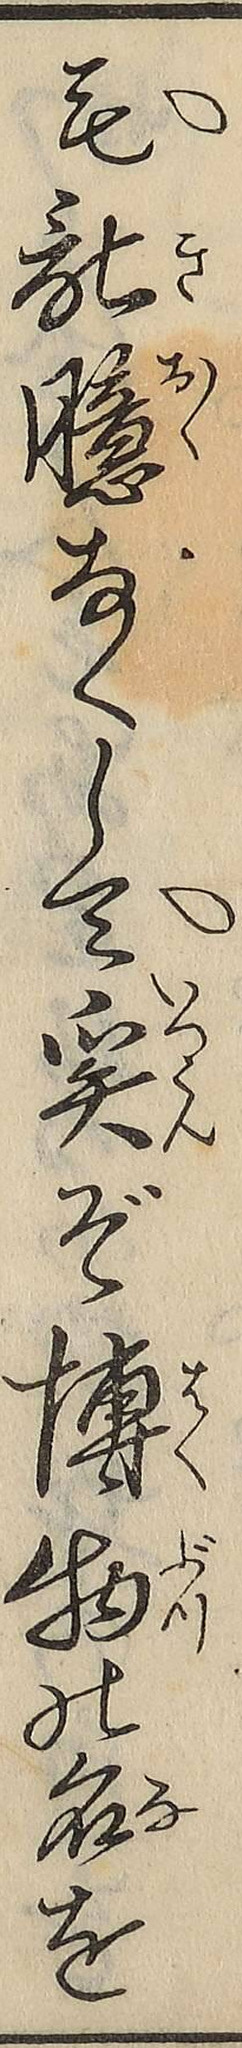も。記臆なくして。奚ぞ博物の名を
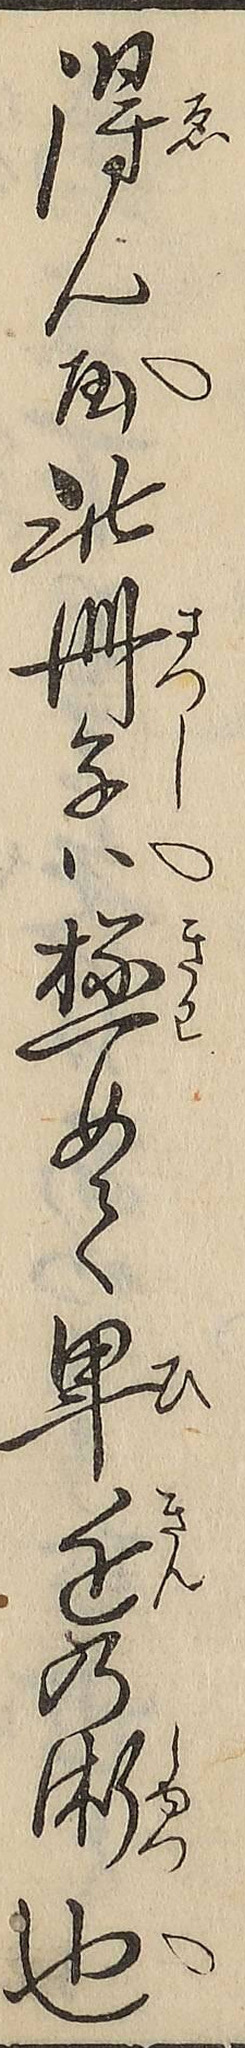得んや。此冊子は極めて卑近の術也。
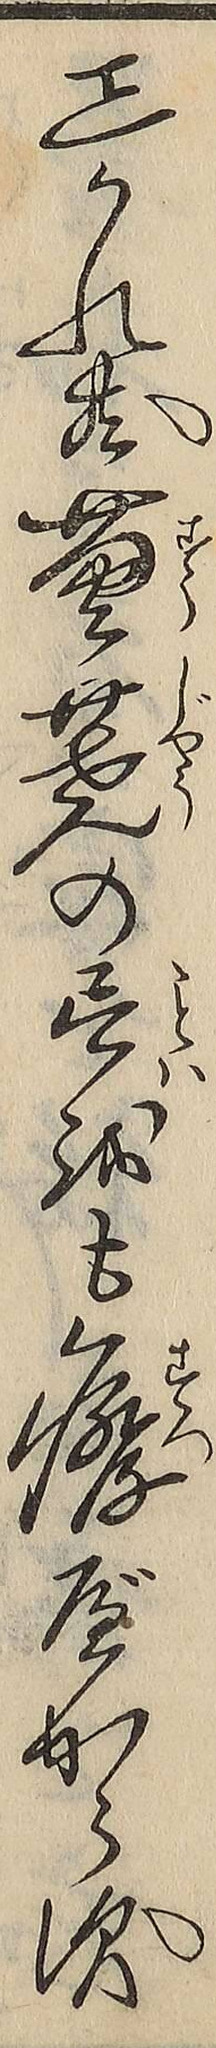しかれ共。蒭蕘の言をも癈べからす。
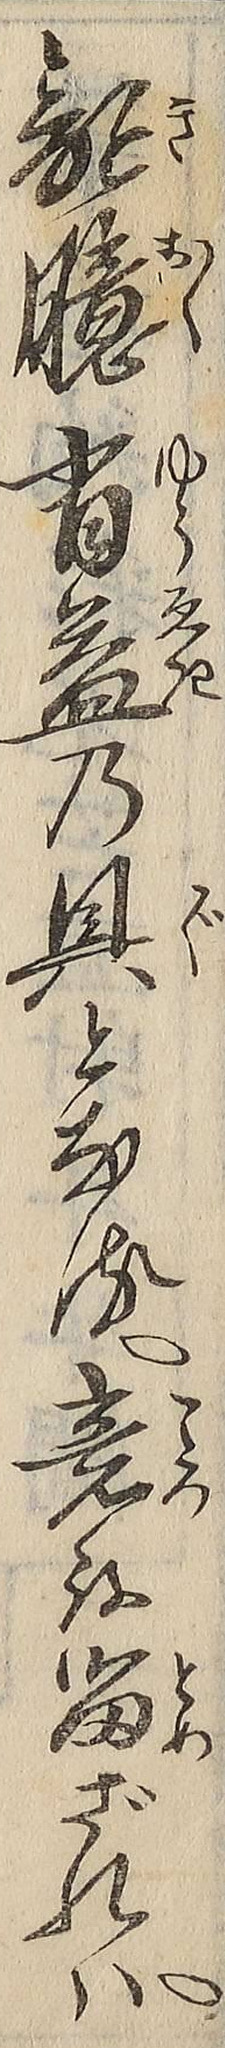記臆有益の具となる。意を留ざれは。
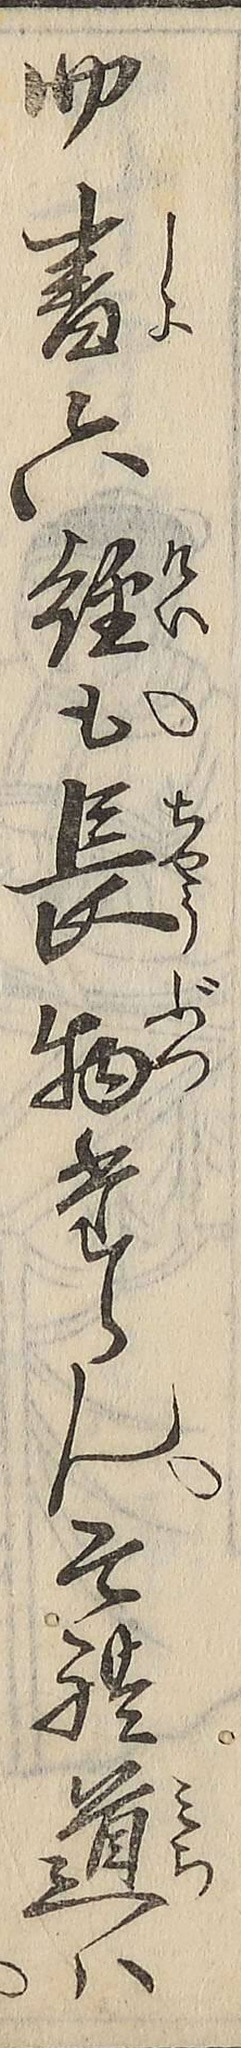四書六経も。長物たらん。それ道は
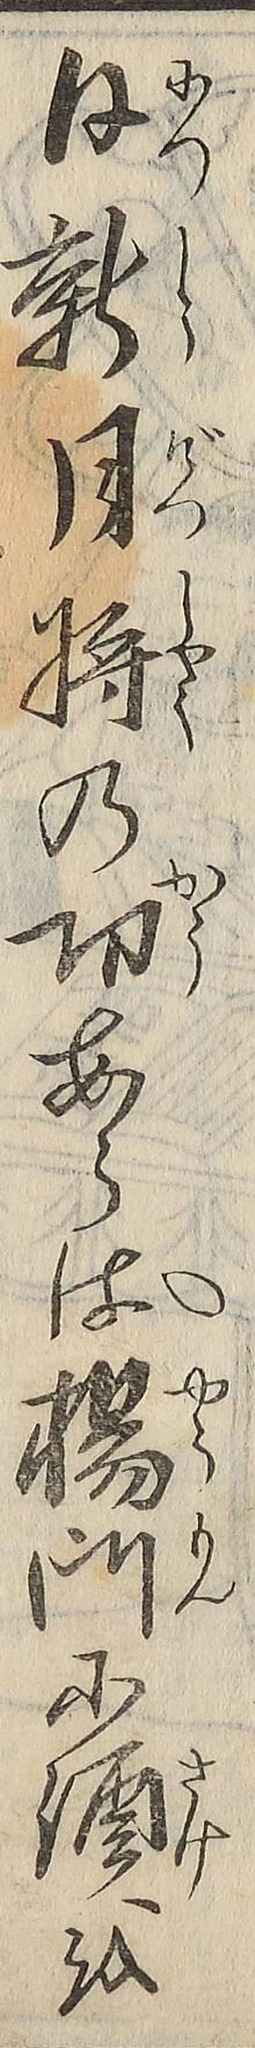日就月将の功あらは。揚門に酒を
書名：物覺秘傳
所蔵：神戸大学附属図書館 国文学研究資料館
